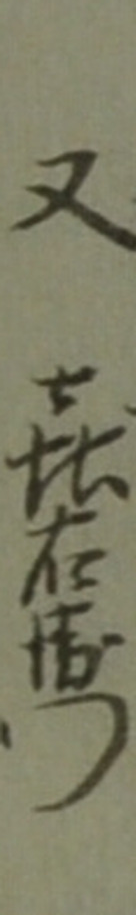三沢喜右衛門
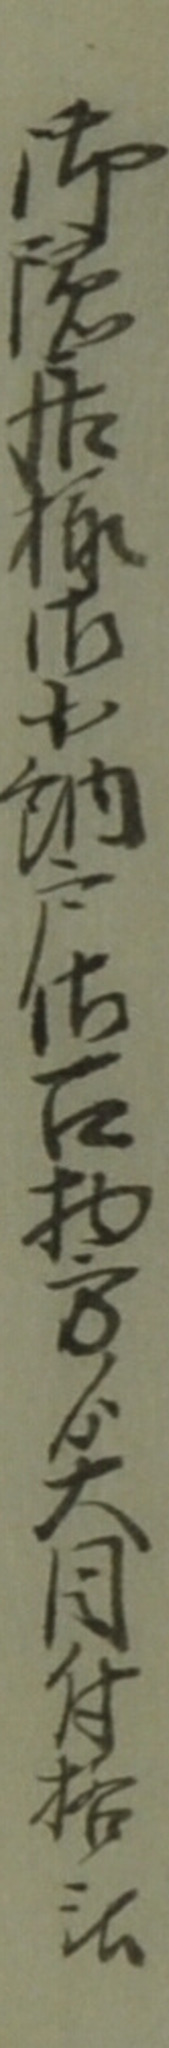御隠居様御小納戸御召物方ゟ大目付格被

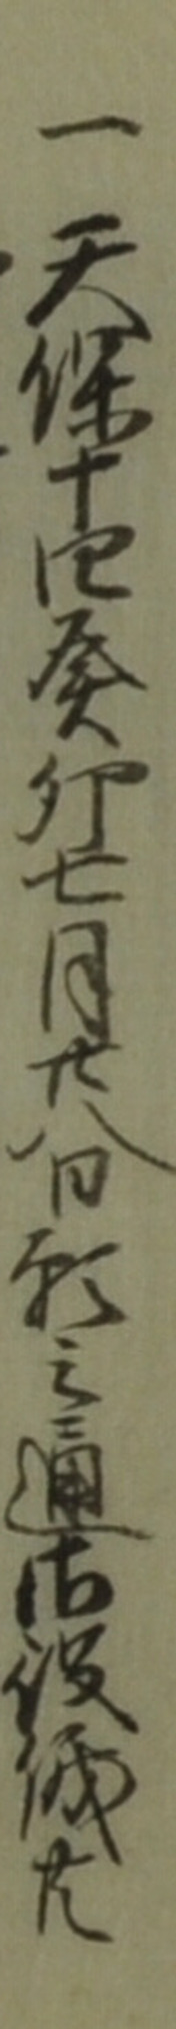一天保十四癸卯七月廿八日願之通御役儀共
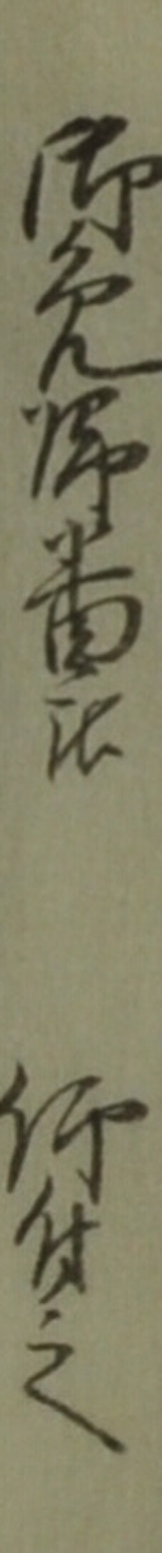御免帰番被仰付之
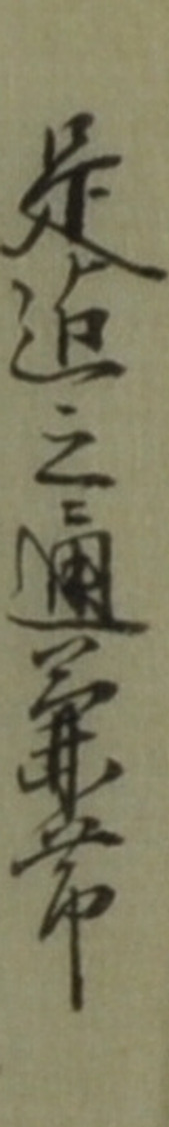是迄之通兼帯
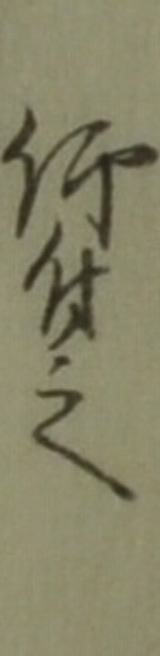仰付之
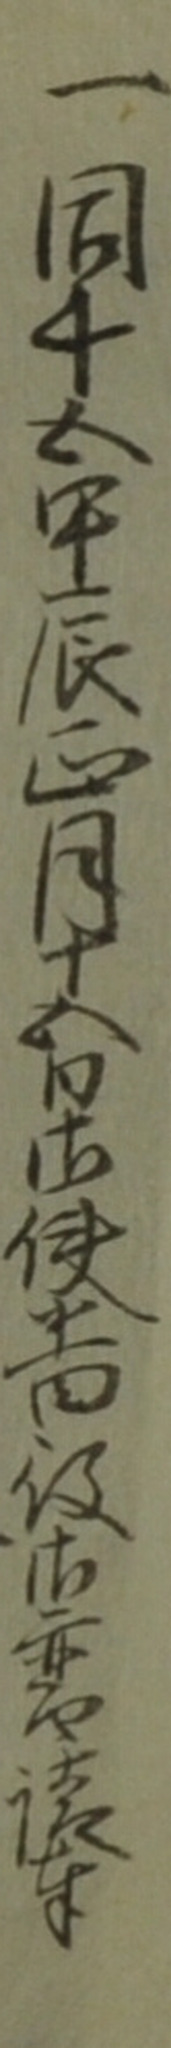一同十五甲辰正月十五日御使番役御普請奉
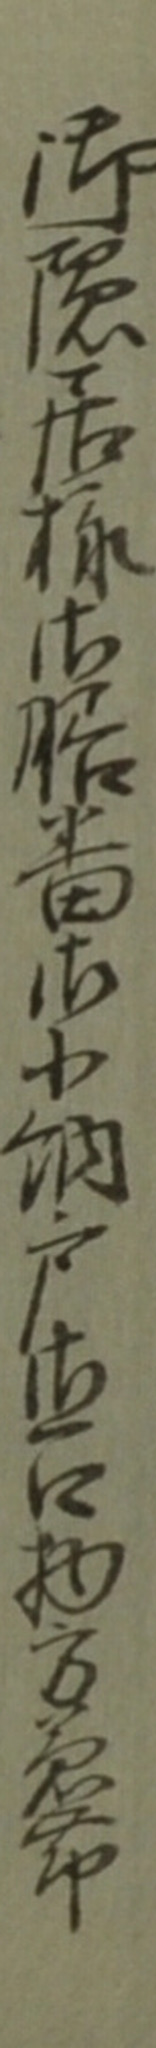御隠居様御膳番御小納戸御召物方兼帯
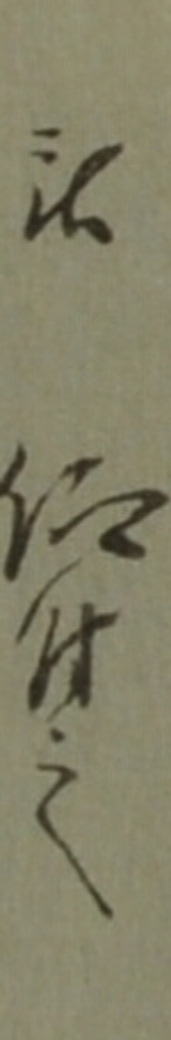被仰付之
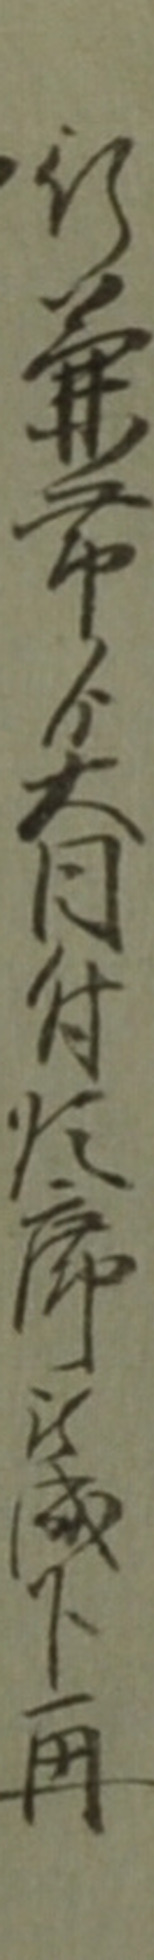行兼帯ゟ大目付順席被成下再
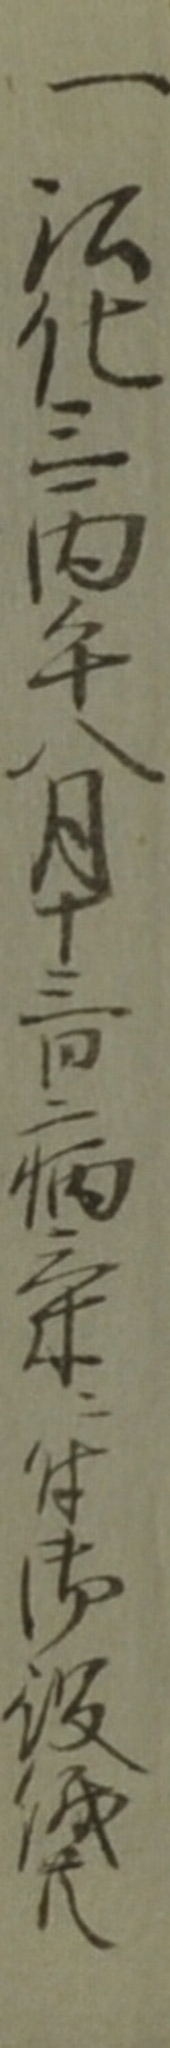一弘化三丙午八月十三日病気二付御役儀共
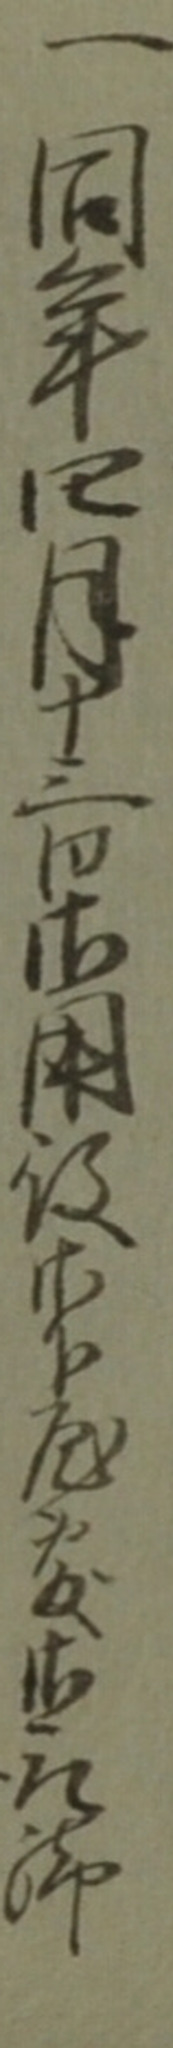一同年四月十三日御用役御下屋敷御取締
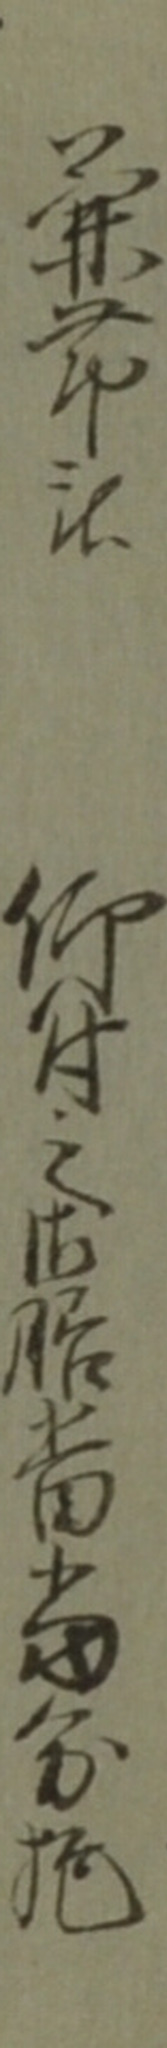兼帯被仰付之御膳番当分抱
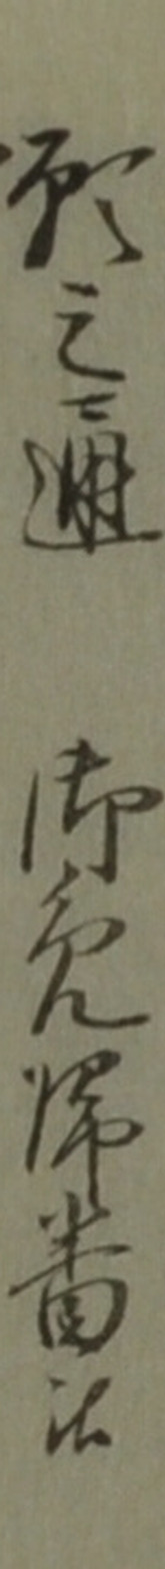願之通御免帰番被
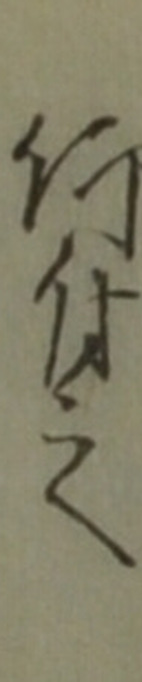仰付之
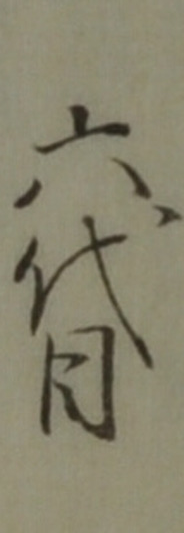六代目
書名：諸御役代々録（四）
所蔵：伊那市立高遠町図書館・合同会社AMANE
